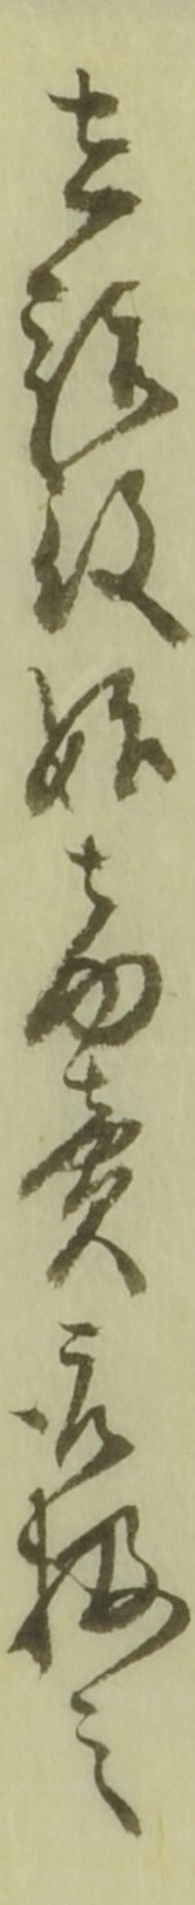世話役始商売取扱之
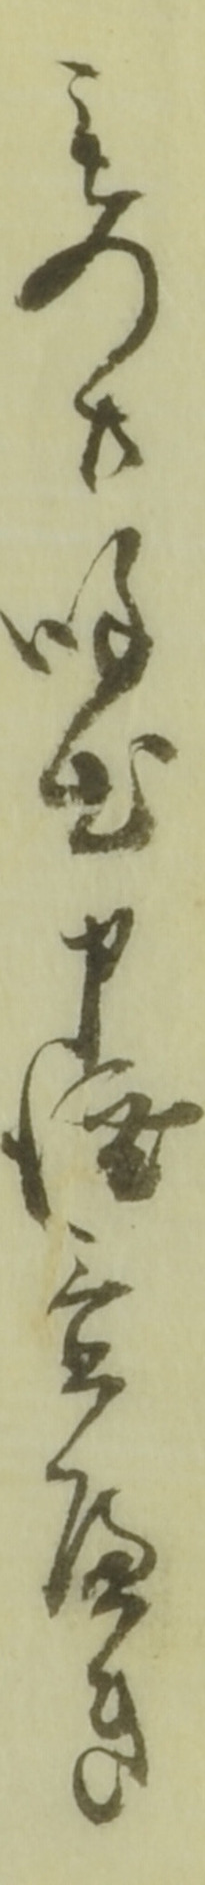もの共呼出申渡置へき
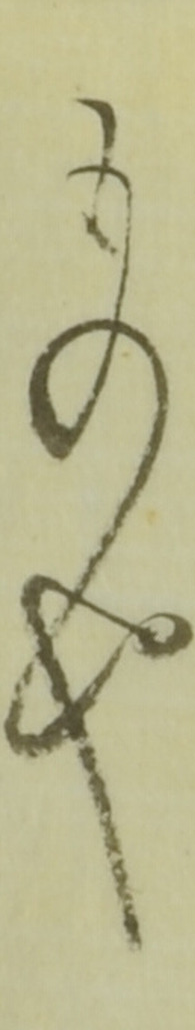もの也
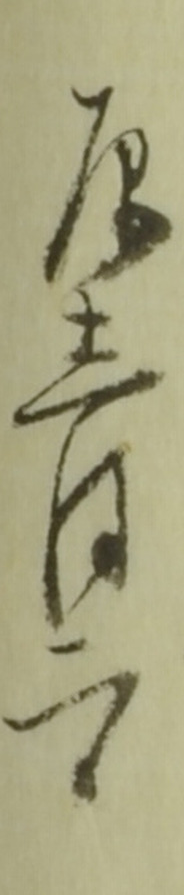辰三月二日

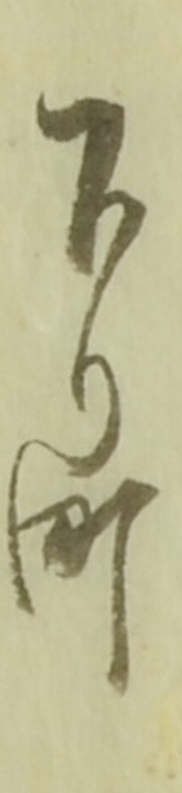下り町
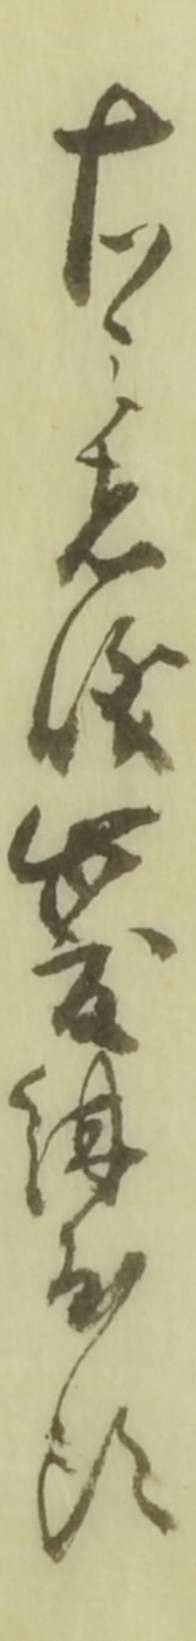右之者儀此度紺屋頭
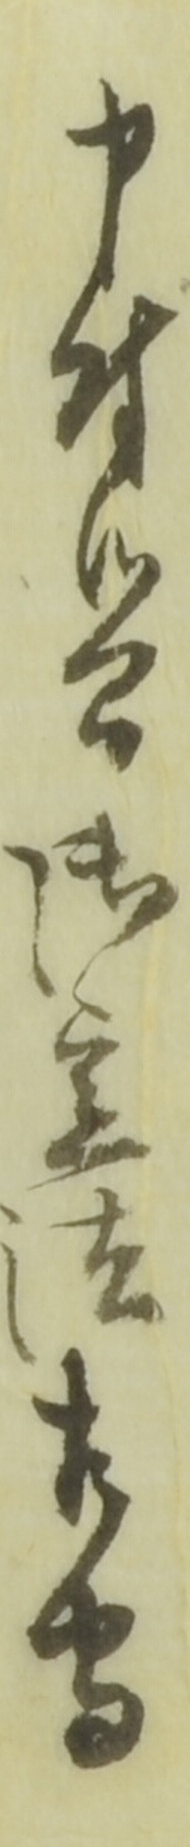申付候間御定法相聞
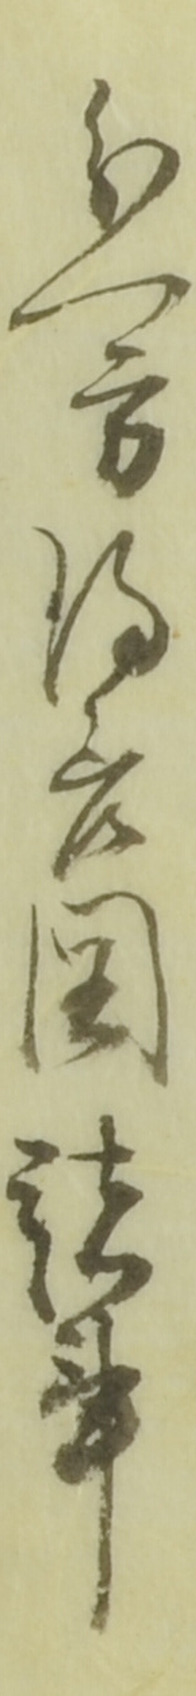分一方得指図諸事
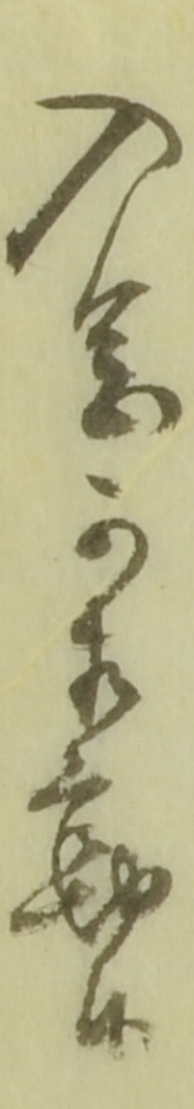入念可相勤候
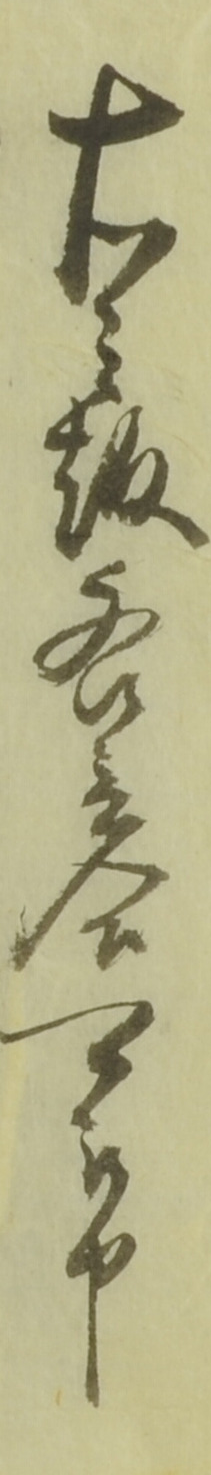右之趣各立合可被申
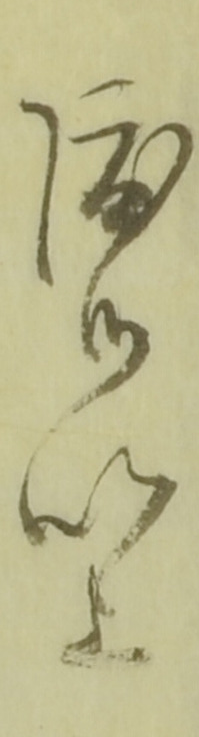渡候以上
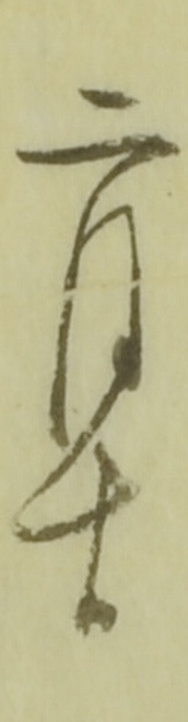二月十日
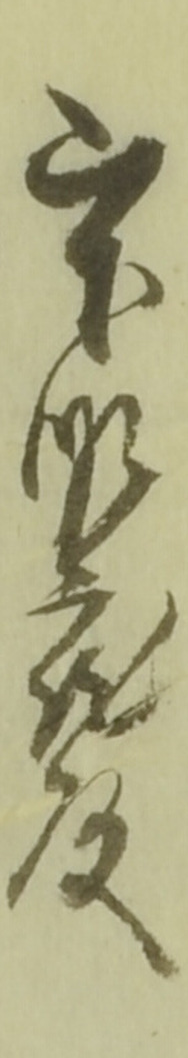山下順蔵殿
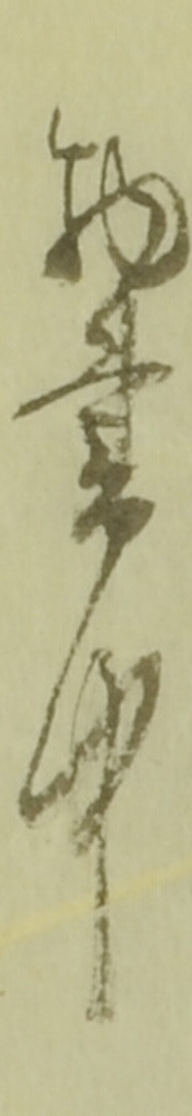物書中
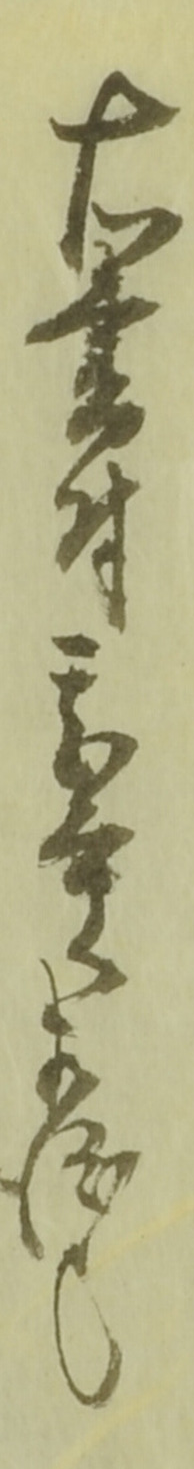右書付甚平相渡申候
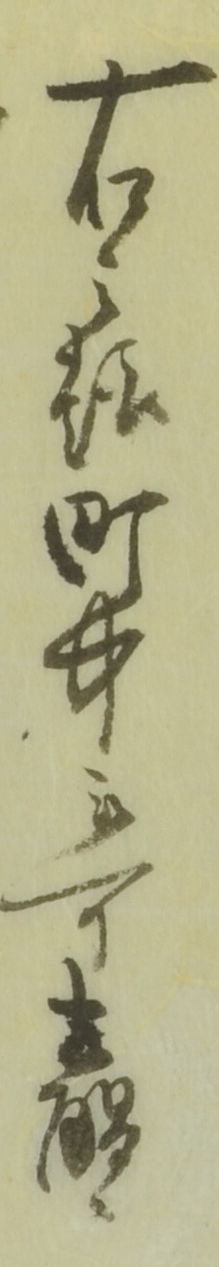右之趣町中江可相触候
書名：御触書御書附控
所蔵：伊那市立高遠町図書館・合同会社AMANE
